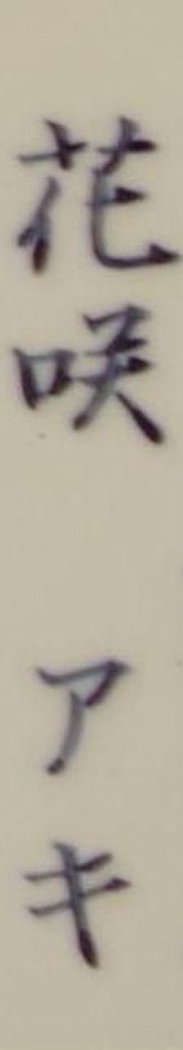花咲アキ
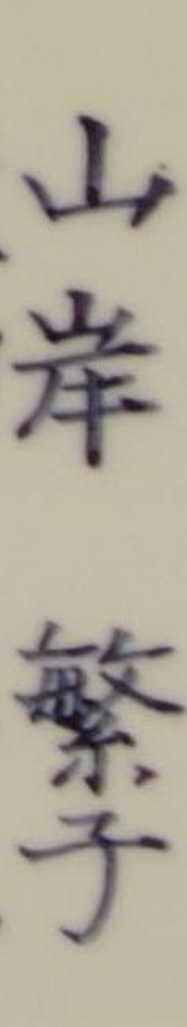山岸繁子
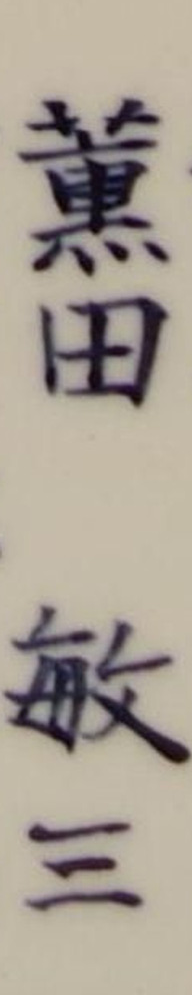薫田敏三
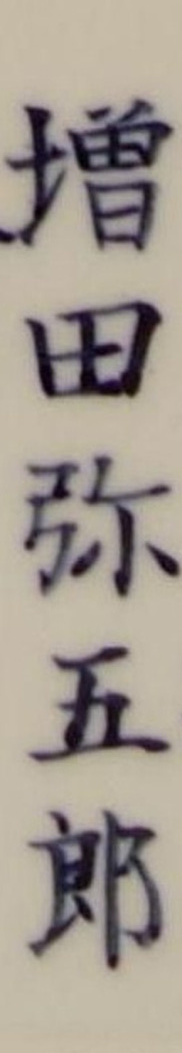増田弥五郎
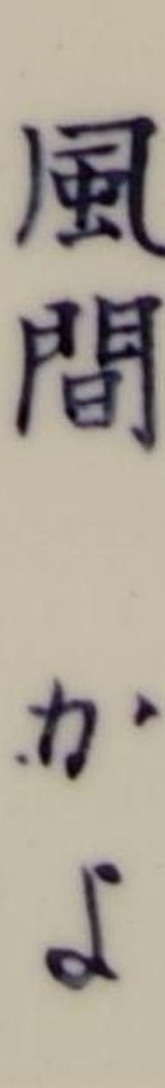風間かよ
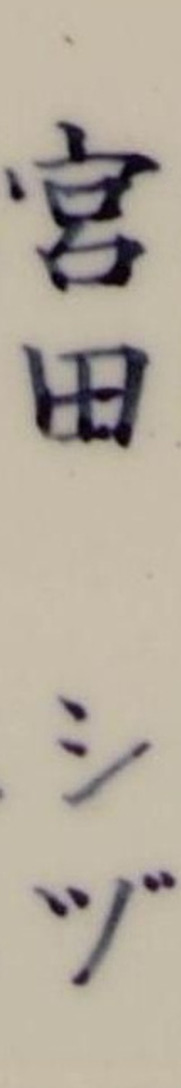宮田シヅ
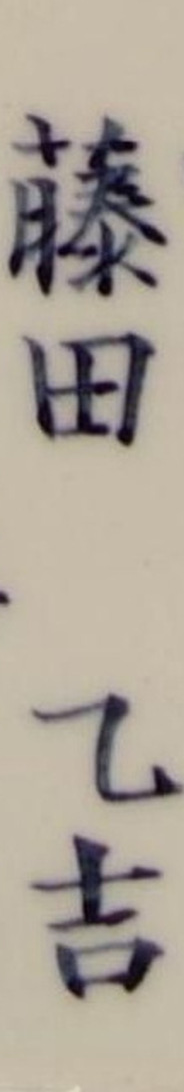藤田乙吉
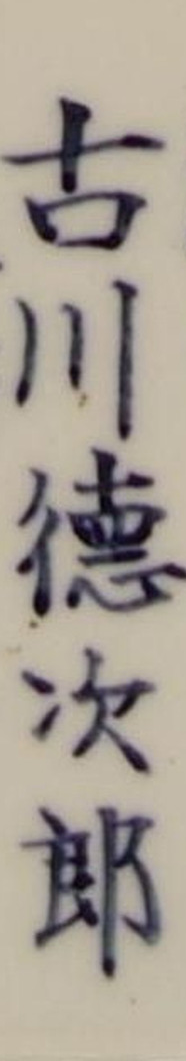古川徳次郎
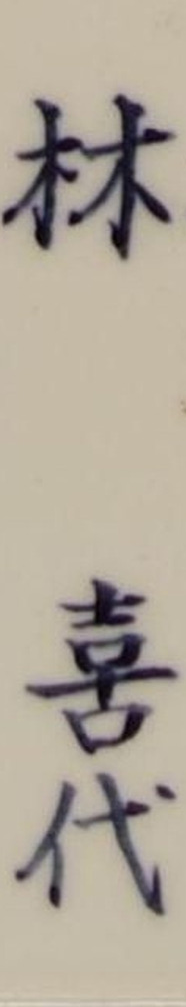林喜代
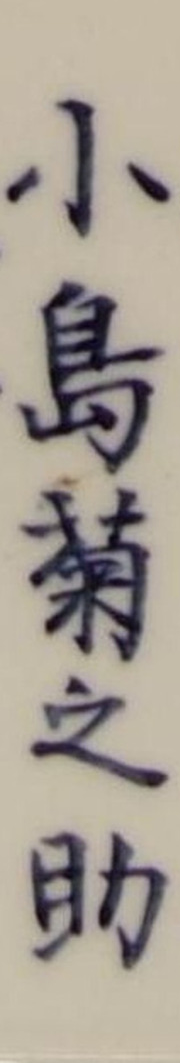小島菊之助
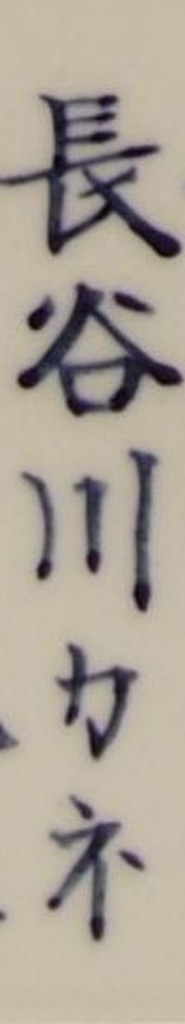長谷川力ネ
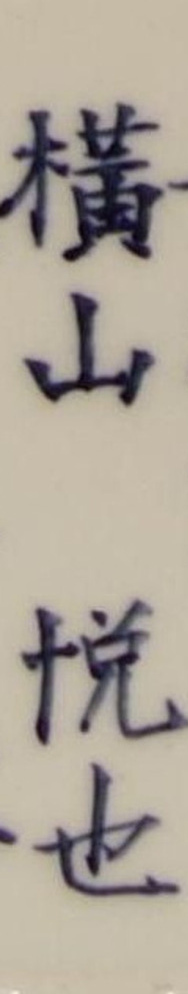横山悦也
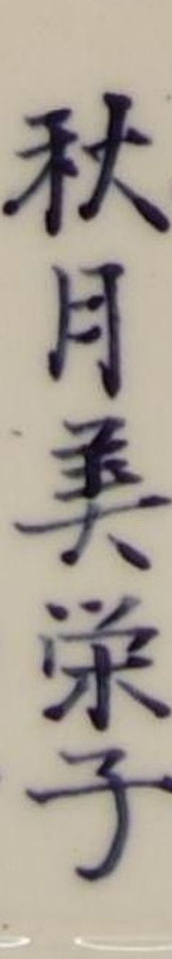秋月美栄子
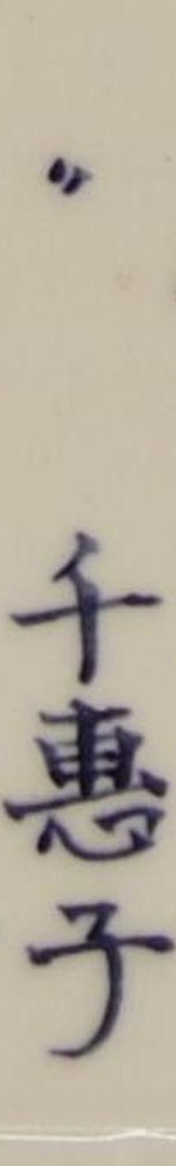千惠子
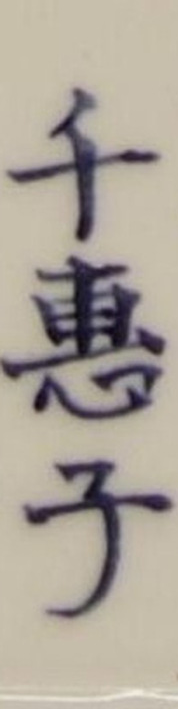千惠子
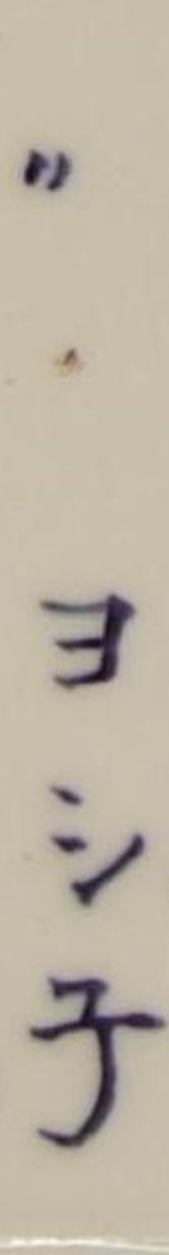ヨシ子
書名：M~S
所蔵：高野山金剛峯寺
